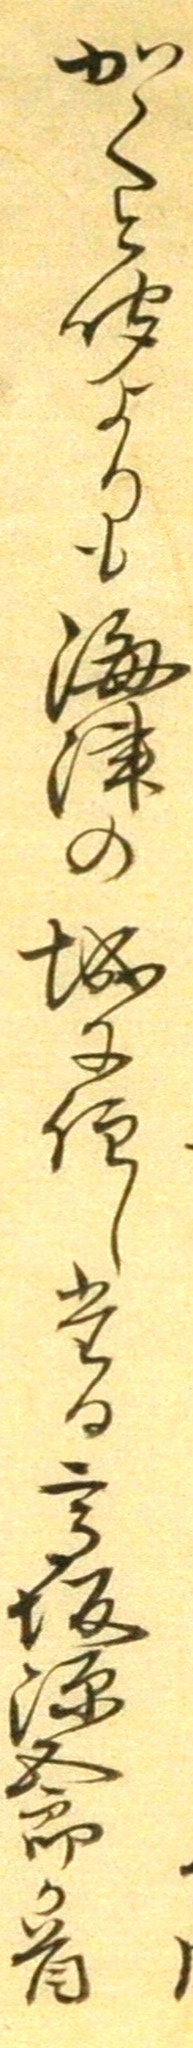かくと聞よりも海津の城に住したる高坂源五郎か首
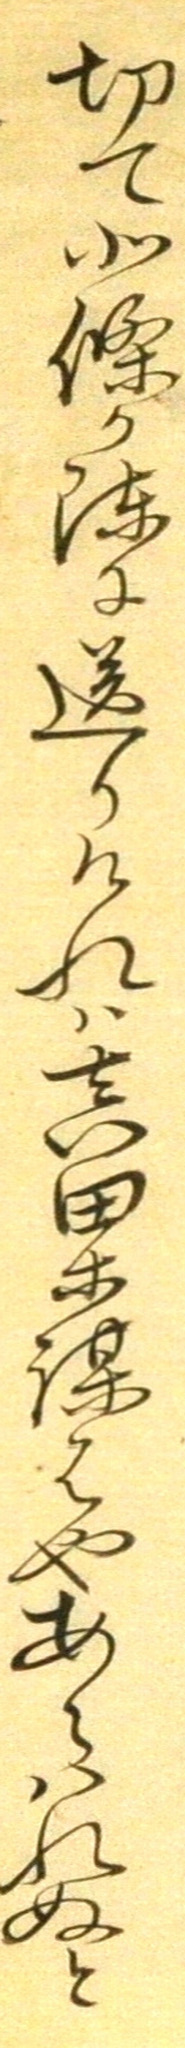切て北条か陣に送りけれは真田等謀はやあらはれぬと
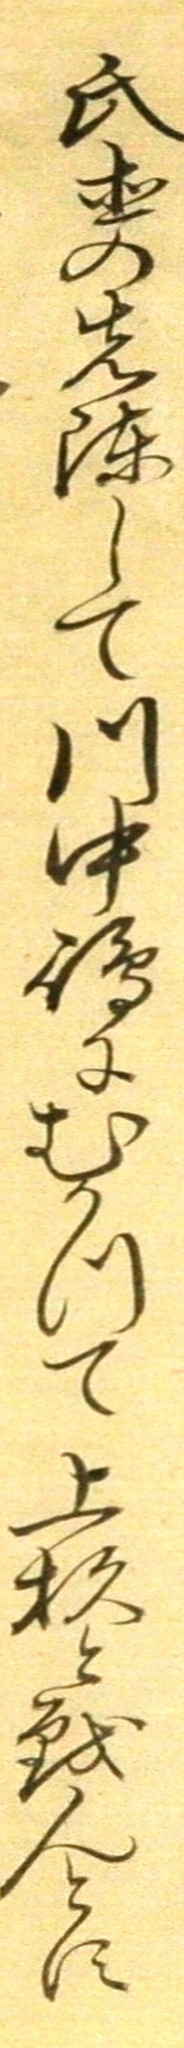氏直の先陣して川中島にむかつて上杉と戦んとす
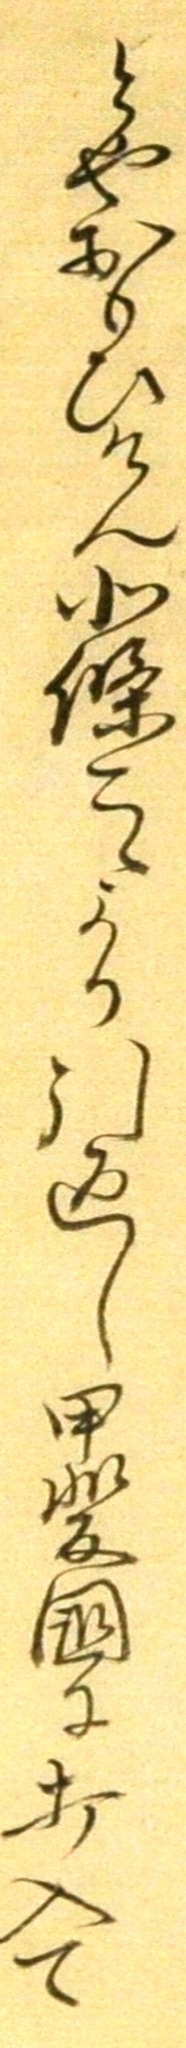とやおもひけん北条こゝより引返し甲斐国に打入て
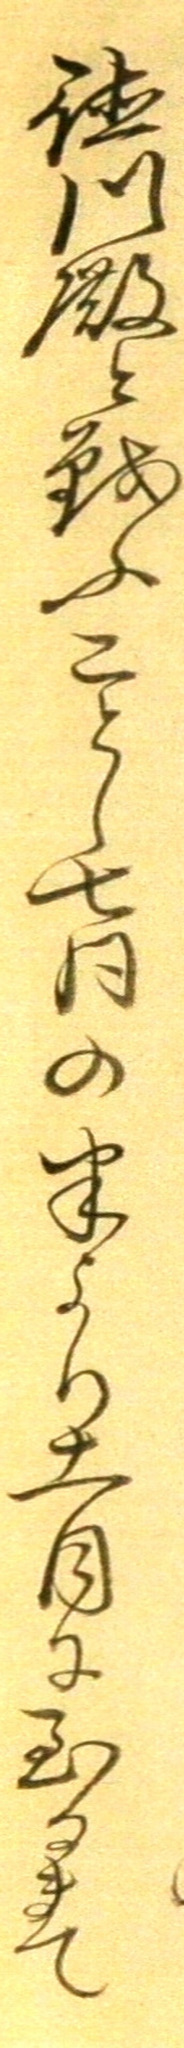徳川殿と戦ふことし七月の半より十一月に至るまて

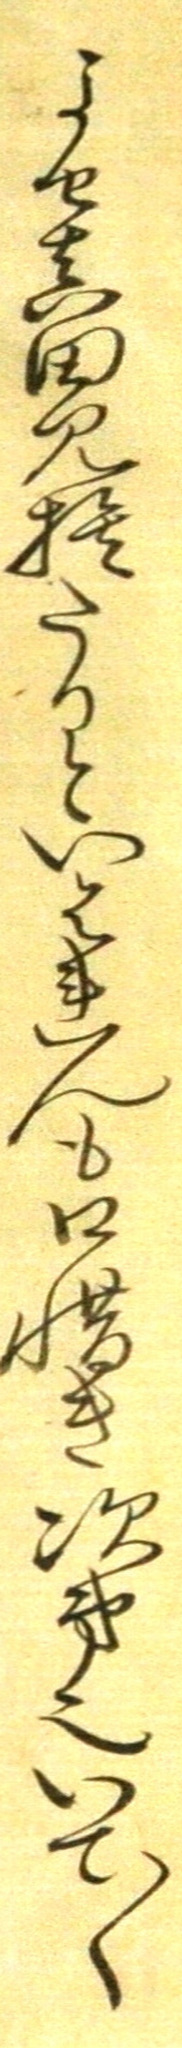よせ真田見捨たりといはれんも口惜き次第也いて〳〵
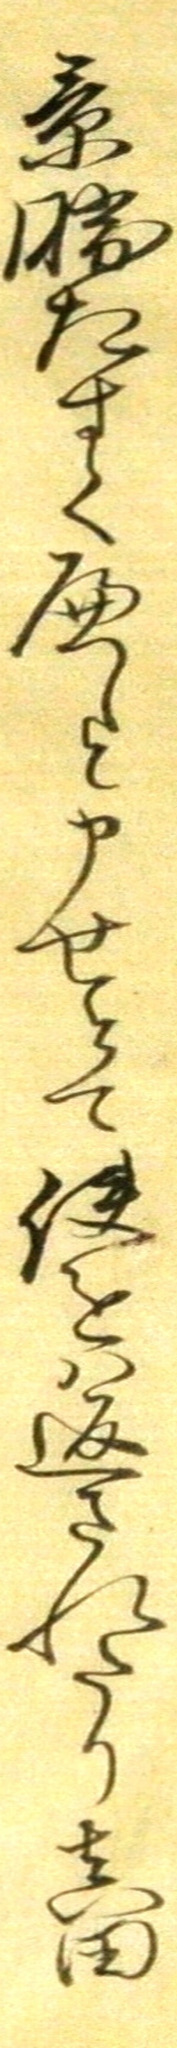景勝たすくへしと申せとて使をは返されたり真田
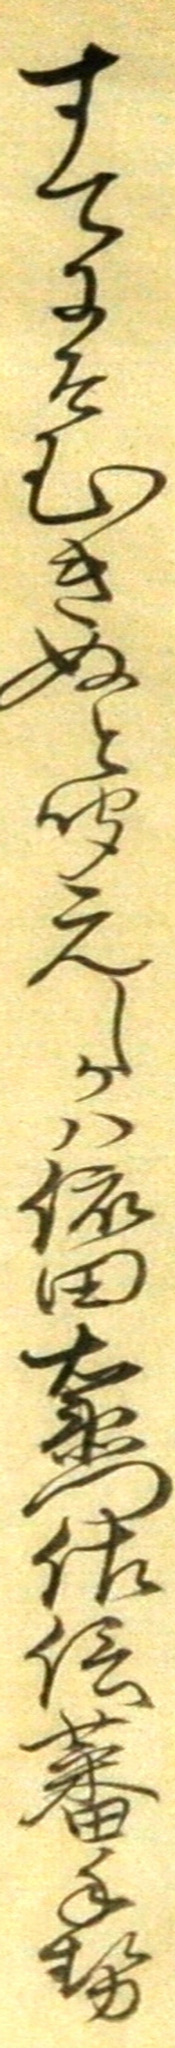すてにそむきぬと聞えしかは依田右衛門佐信蕃手勢
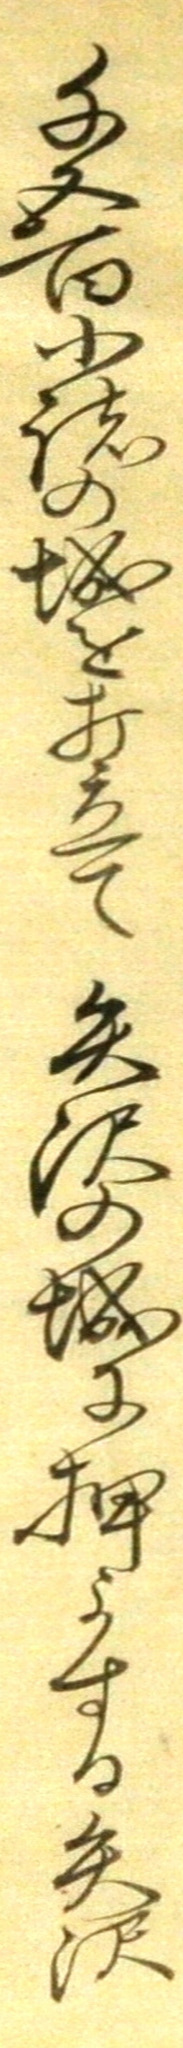千五百小諸の城を打立て矢沢の城に押よする矢沢
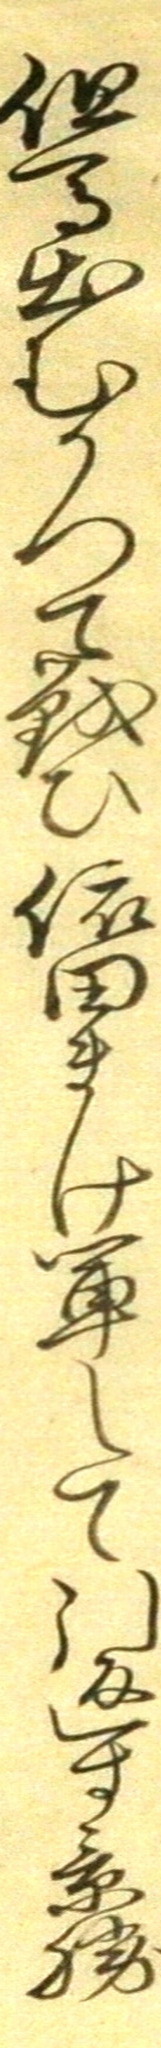但馬出むかつて戦ひ依田まけ軍して引返す景勝
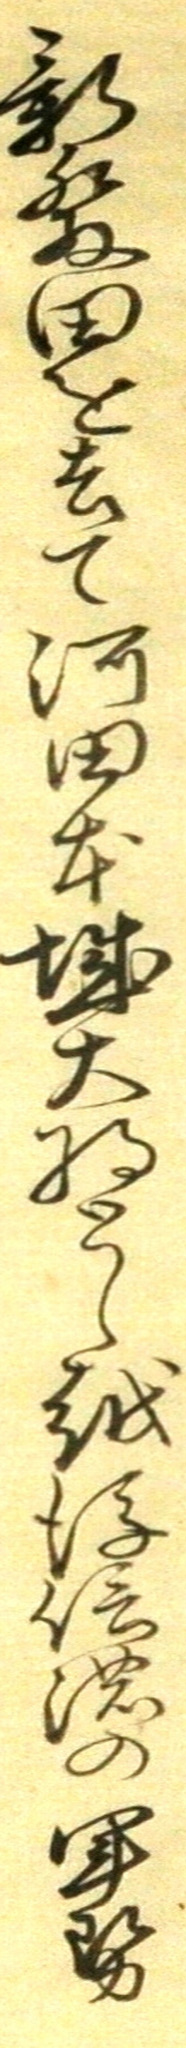新発田を去て河田本城大将とし越後信濃の軍勢
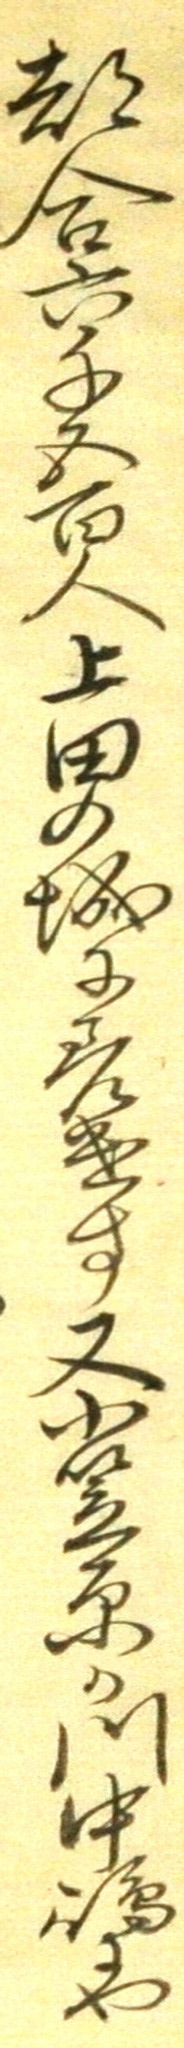都合六千五百人上田の城に差遣す又小笠原か川中島にや
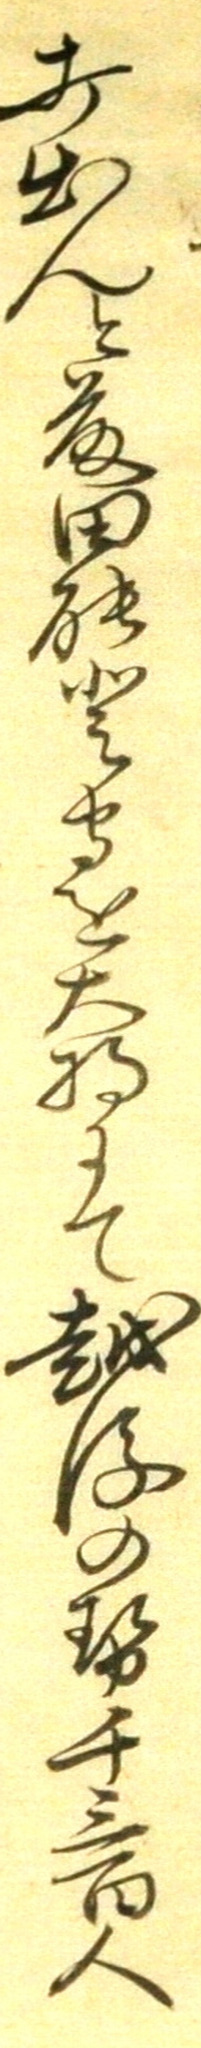打出んと藤田能登守を大将にて越後の勢千三百人
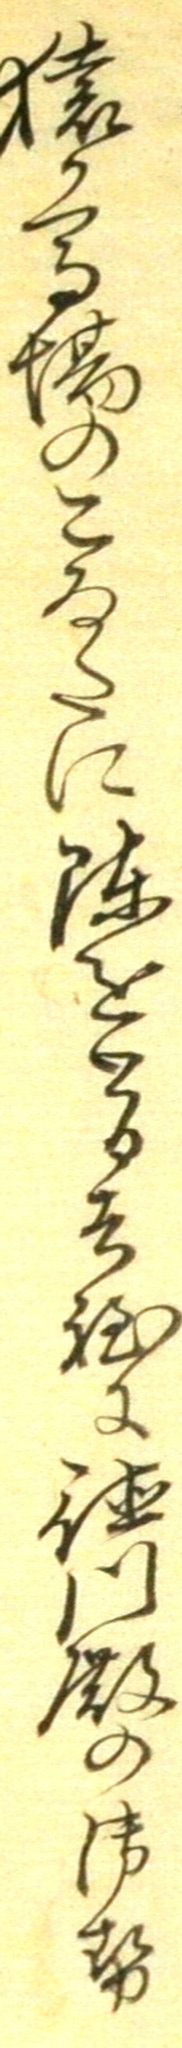猿か馬場のこなたに陣をとる去程に徳川殿の御勢
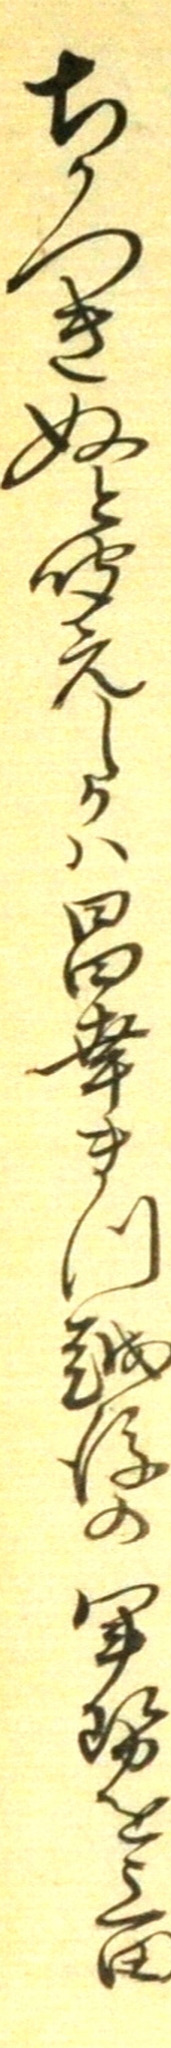ちかつきぬと聞えしかは昌幸まつ越後の軍勢を上田
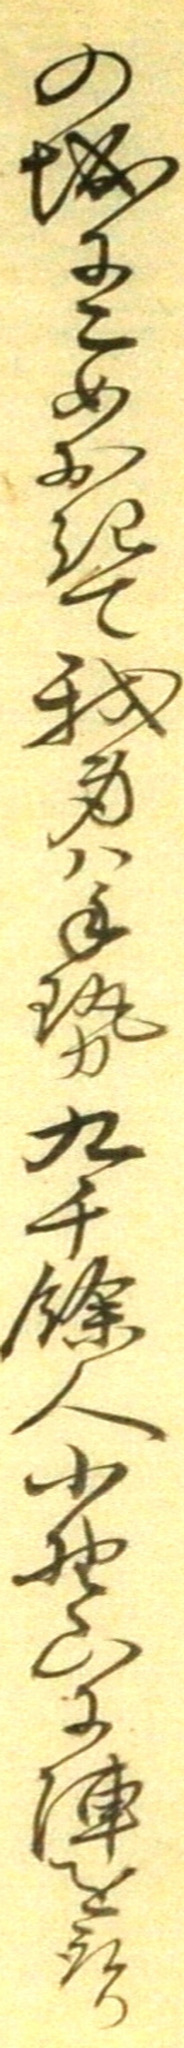の城にこめおきて我身は手勢九千余人小野山に陣を取り
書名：藩翰譜（九・上）
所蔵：伊那市立高遠町図書館・合同会社AMANE
